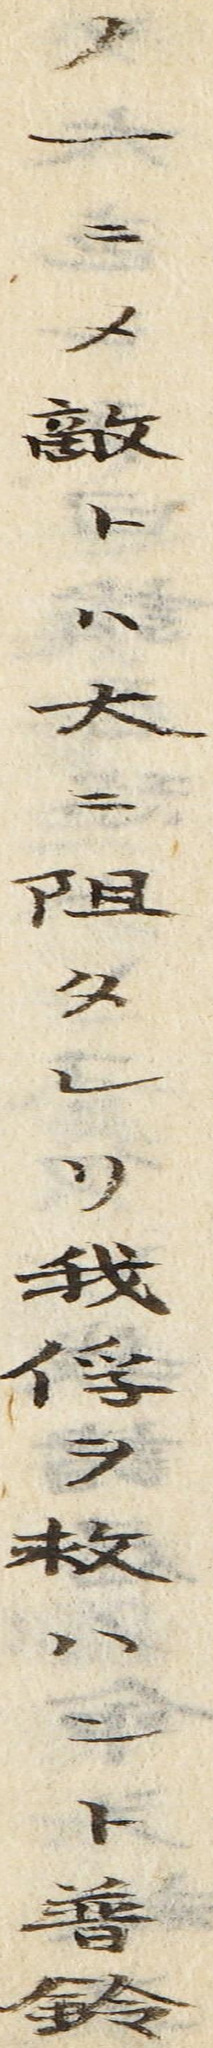ノ一ニシテ敵トハ大ニ阻タレリ我俘ヲ救ハント普鈴
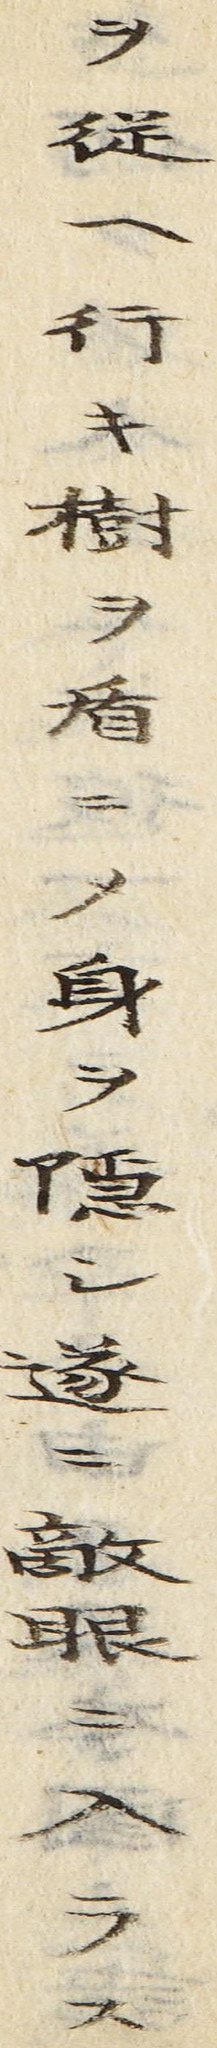ヲ従ヘ行キ樹ヲ盾ニシテ身ヲ隠シ遂ニ敵眼ニ入ラス
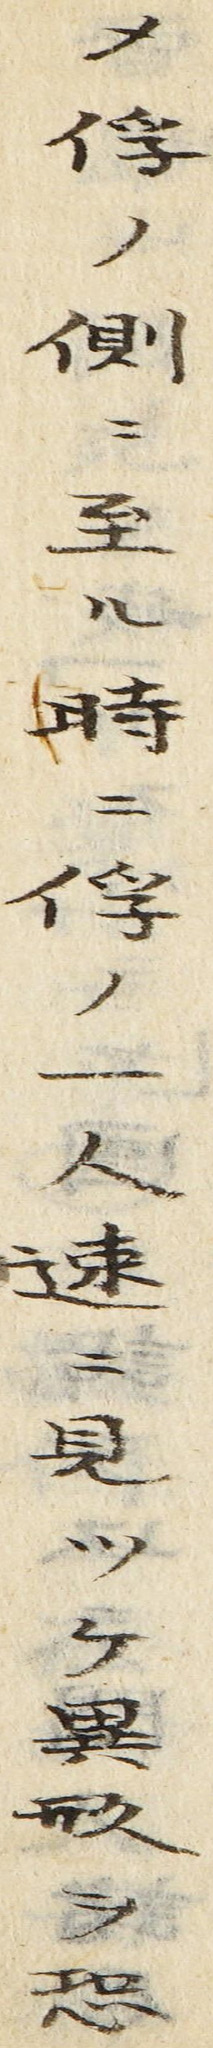シテ俘ノ側ニ至ル時ニ俘ノ一人速ニ見ツケ異形ヲ恐

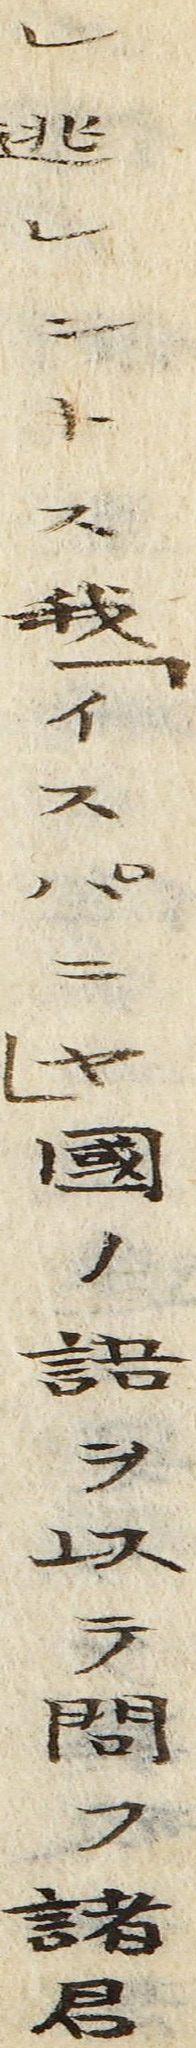レ逃レントス我「イスパニヤ」国ノ語ヲ以テ問フ諸君
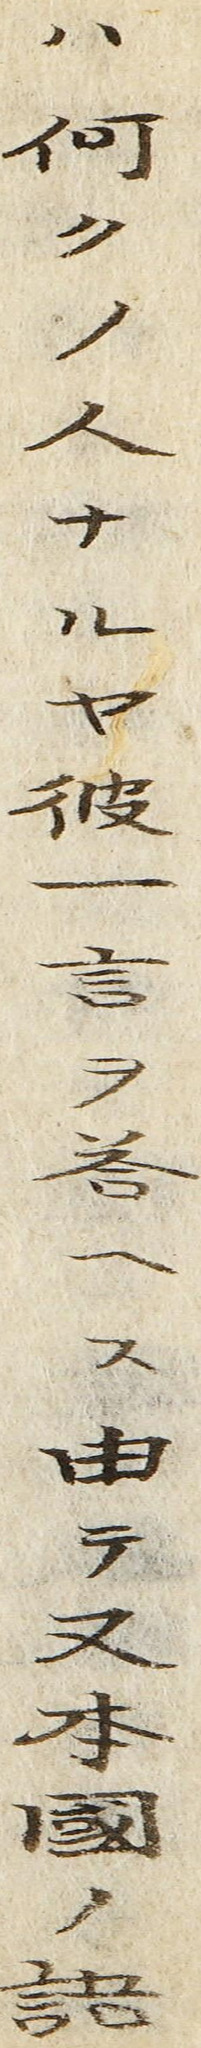ハ何クノ人ナルヤ彼一言ヲ答ヘス由テ又本国ノ語
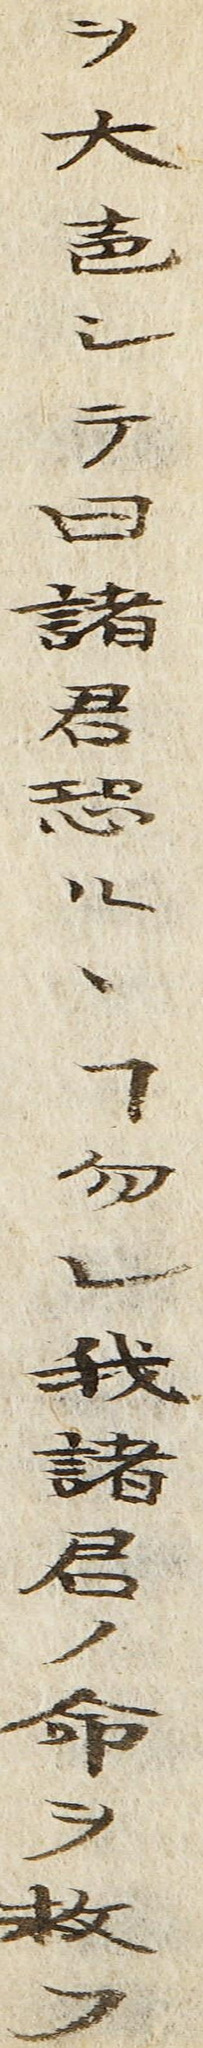ヲ大声シテ曰諸君恐ルヽコト勿レ我諸君ノ命ヲ救フ
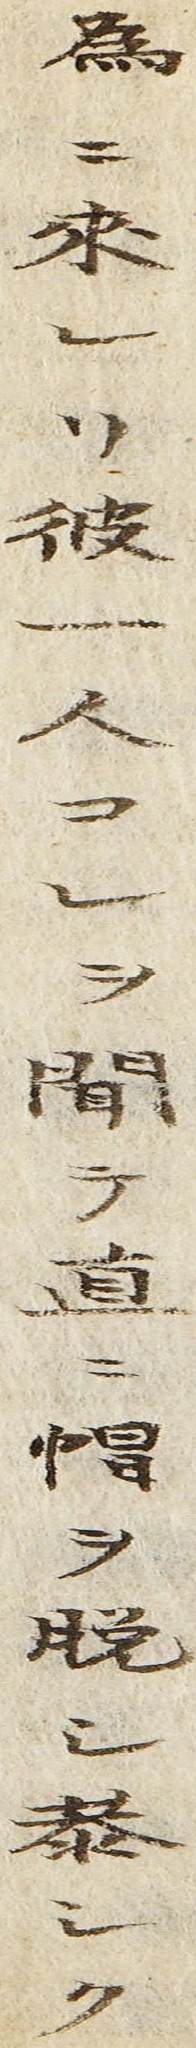為ニ来レリ彼一人コレヲ聞テ直ニ帽ヲ脱シ恭シク
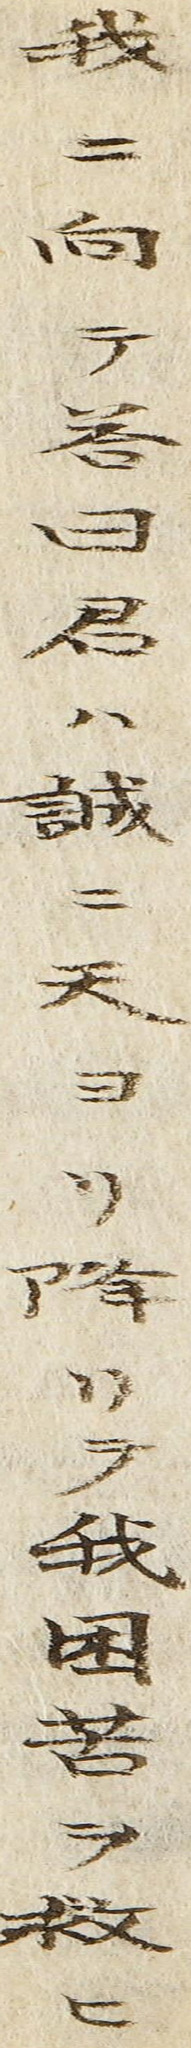我ニ向テ答曰君ハ誠ニ天ヨリ降リテ我困苦ヲ救ヒ
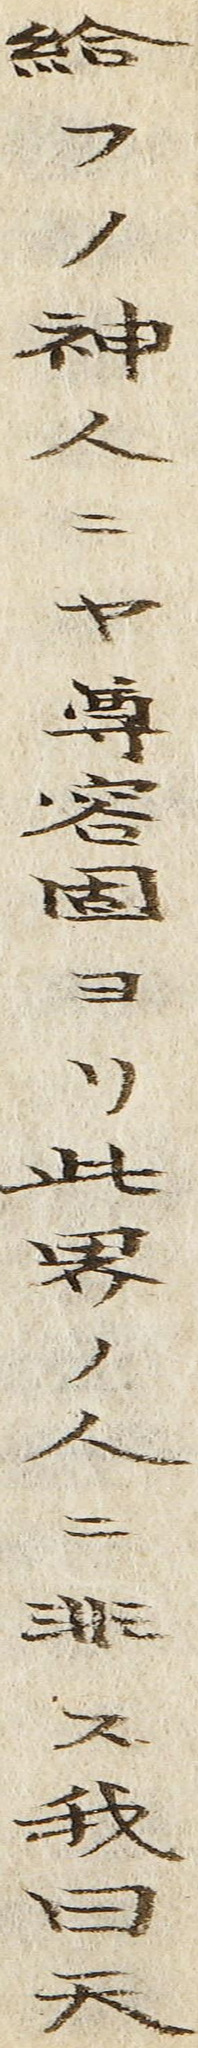給フノ神人ニヤ尊容固ヨリ此界ノ人ニ非ス我曰天
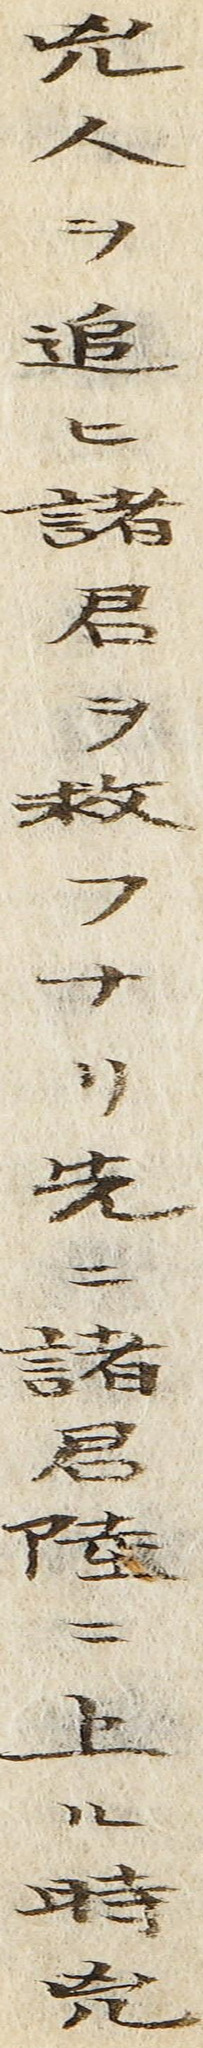兇人ヲ追ヒ諸君ヲ救フナリ先ニ諸君陸ニ上ル時兇
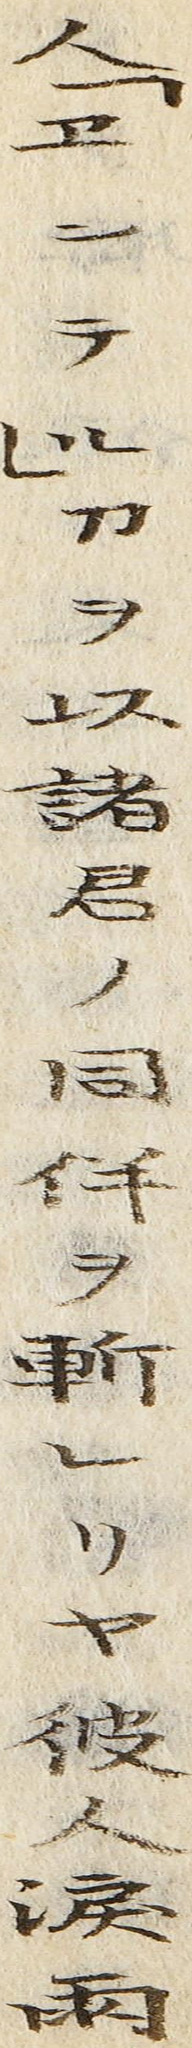人「ヱンテル」刀ヲ以諸君ノ同伴ヲ斬レリヤ彼人涙雨
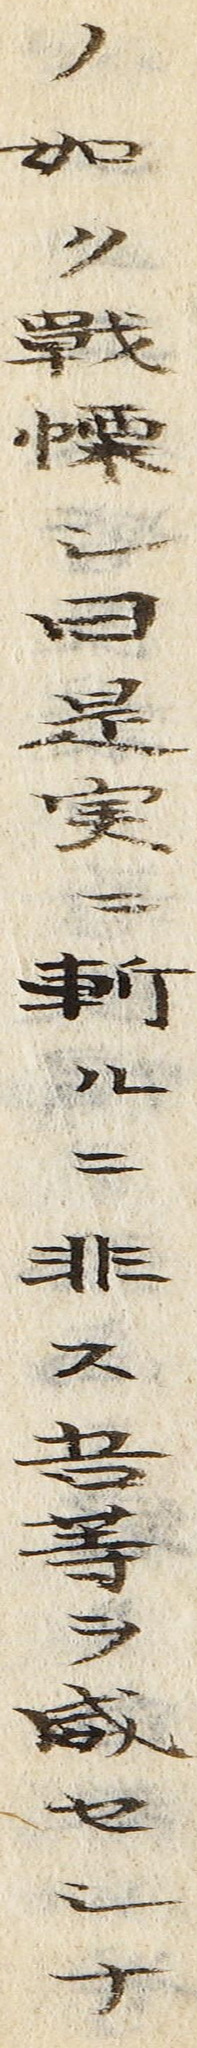ノ如ク戦慄シ曰是実ニ斬ルニ非ス吾等ヲ威セシナ
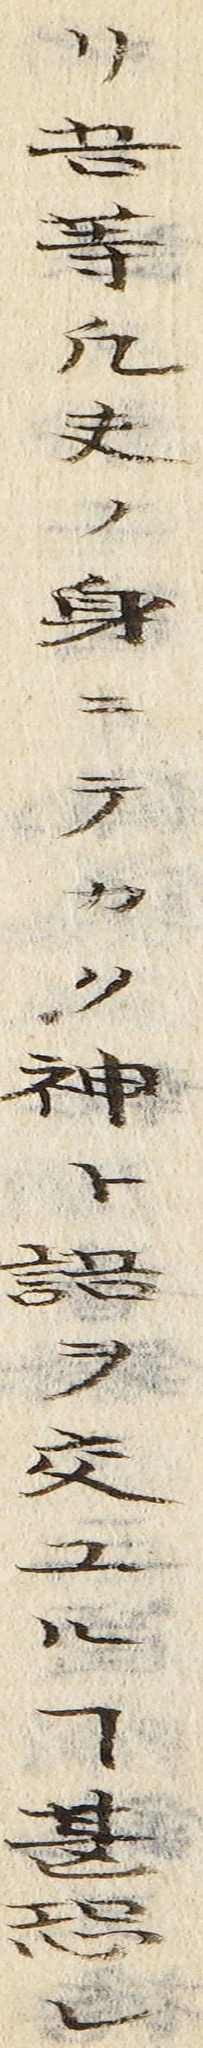リ吾等凡夫ノ身ニテカク神ト語ヲ交ユルコト甚恐レ
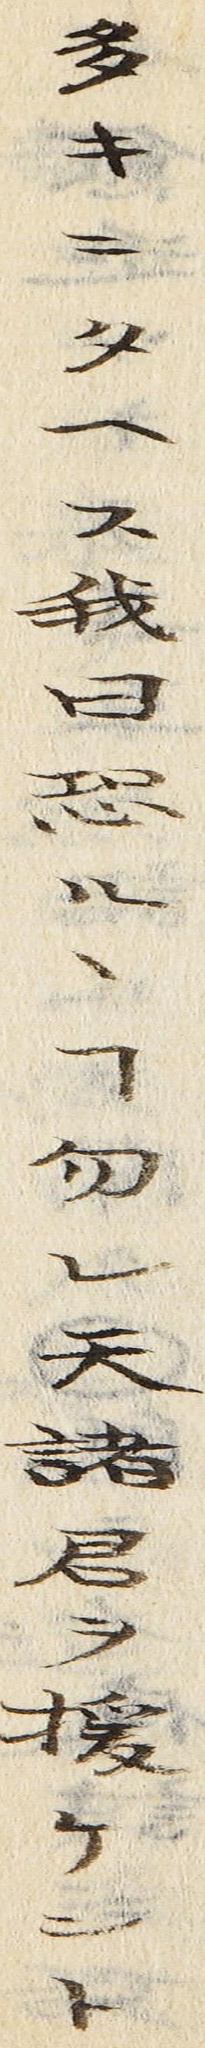多キニタヘス我曰恐ルヽコト勿レ天諸君ヲ援ケント
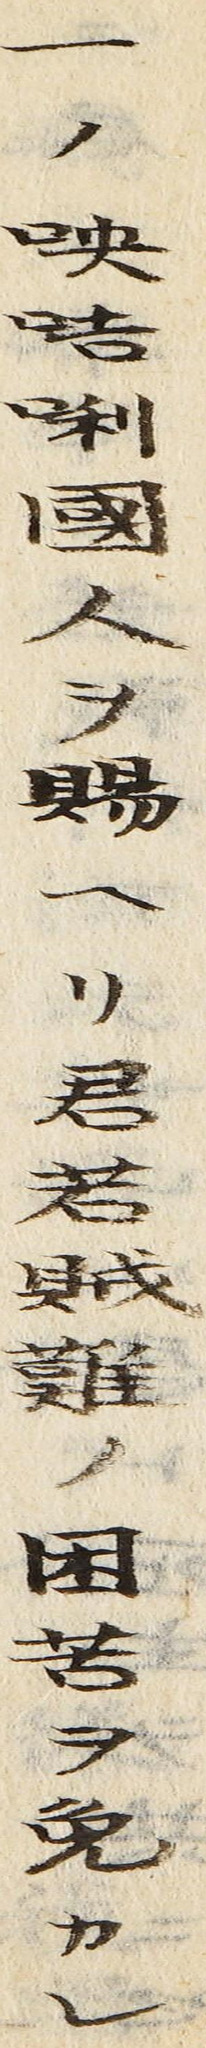一ノ咉咭唎国人ヲ賜ヘリ君若賊難ノ困苦ヲ免カレ
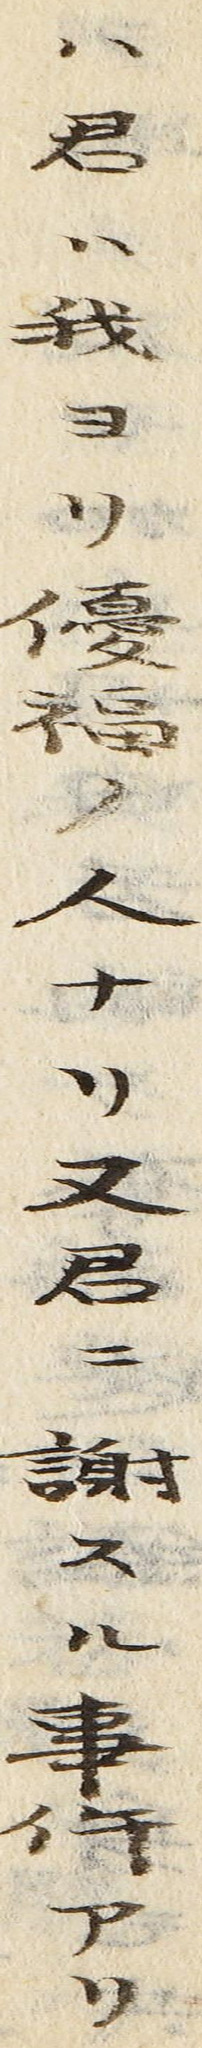ハ君ハ我ヨリ優福ノ人ナリ又君ニ謝スル事件アリ
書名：漂流紀事
